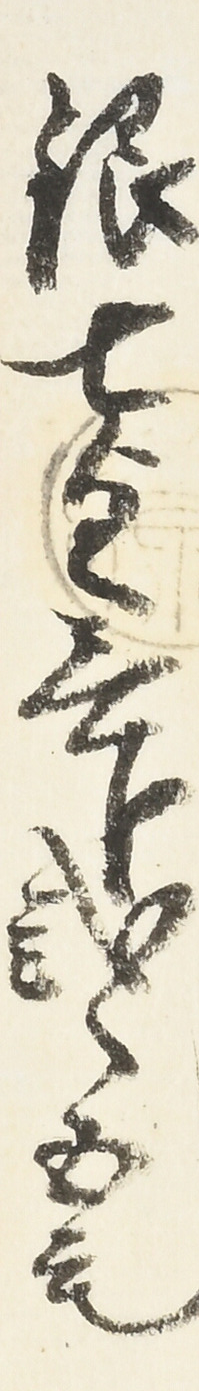銀七匁三分弐厘五毛
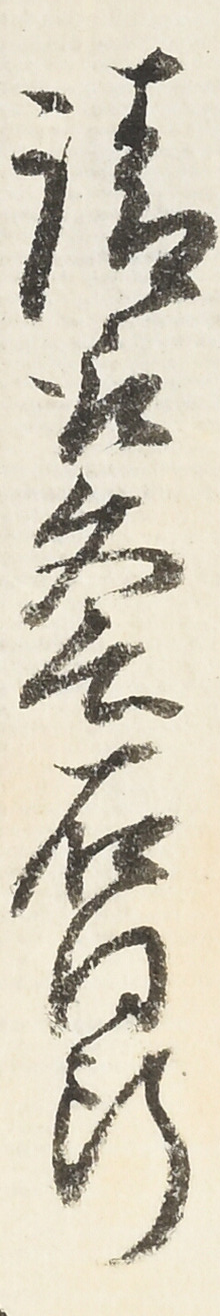請取文言右同断
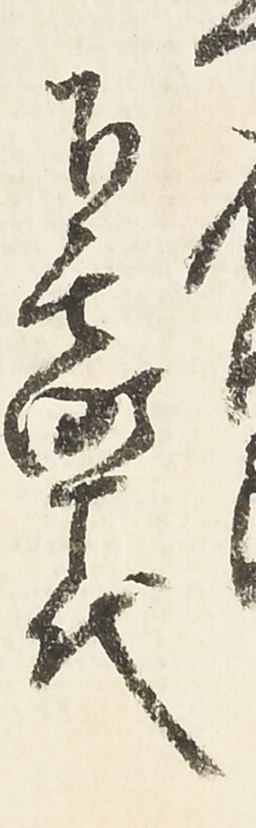下モ町丁代
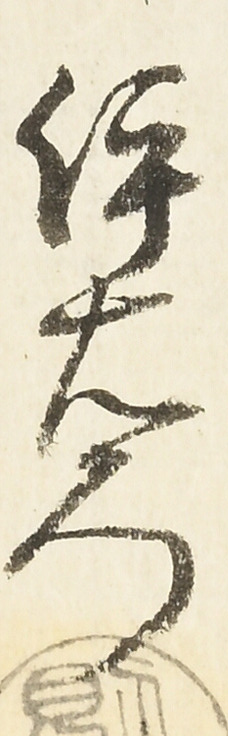伊右衛門
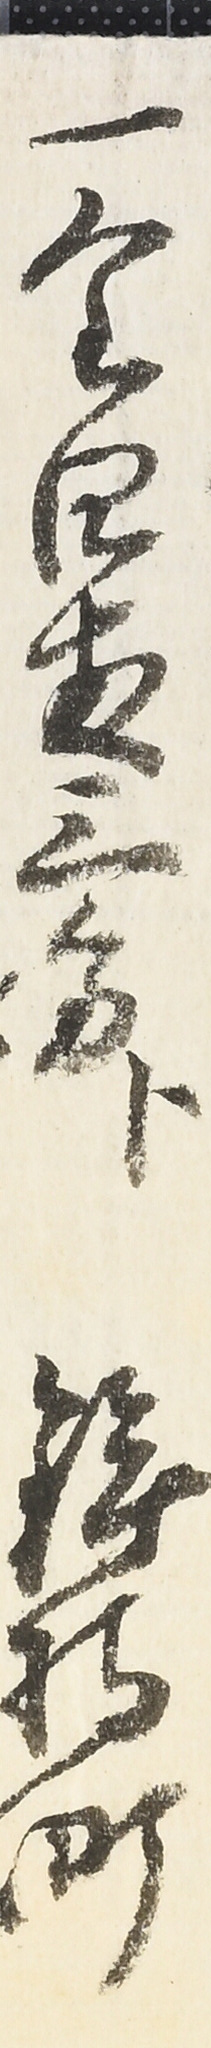一金四両三分ト鉾持町
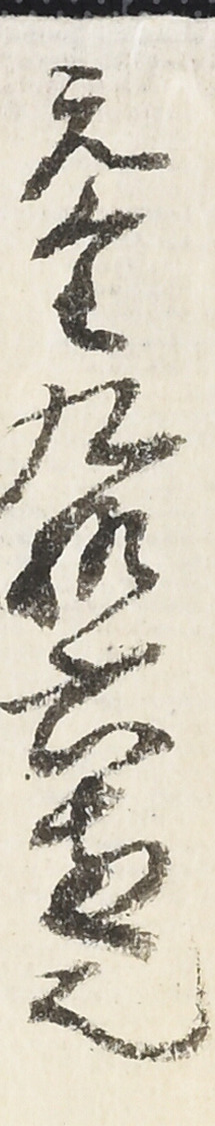元金九拾六両也
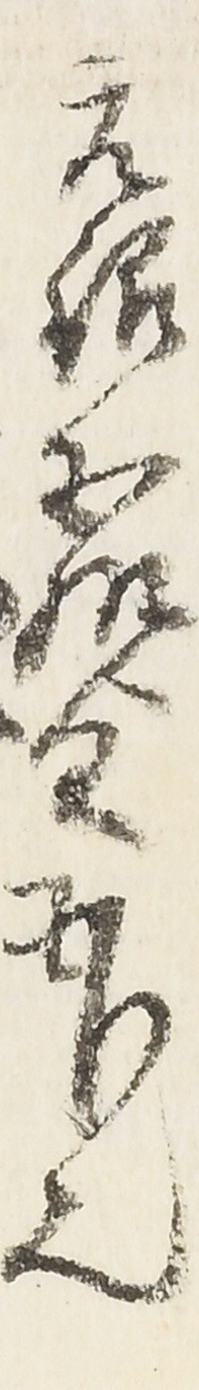元銀五拾匁五分也
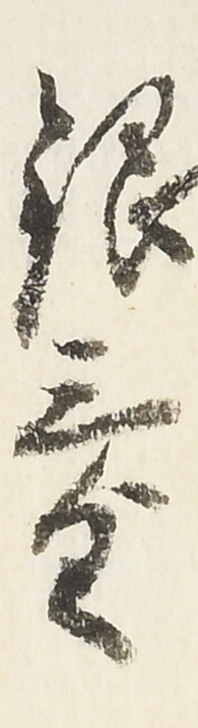銀三匁
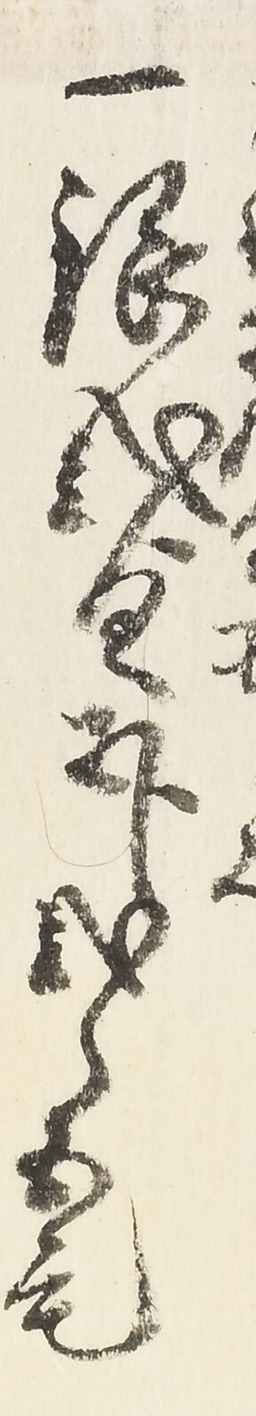一銀弐匁五分弐厘五毛
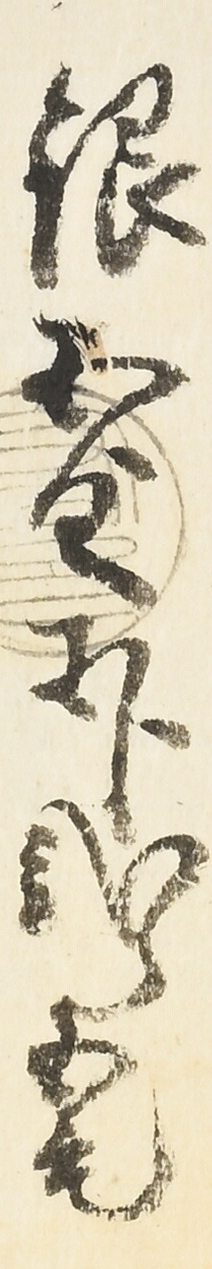銀五匁五分弐厘五毛
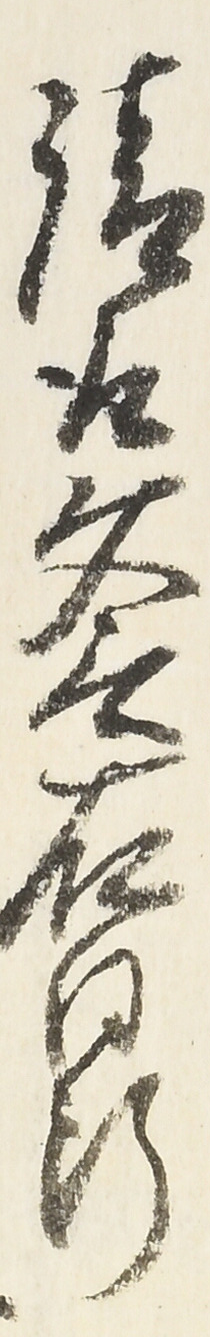請取文言右同断
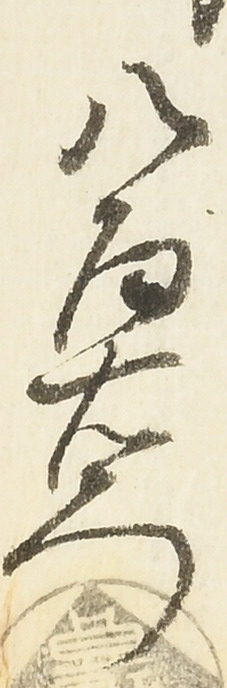八百右衛門
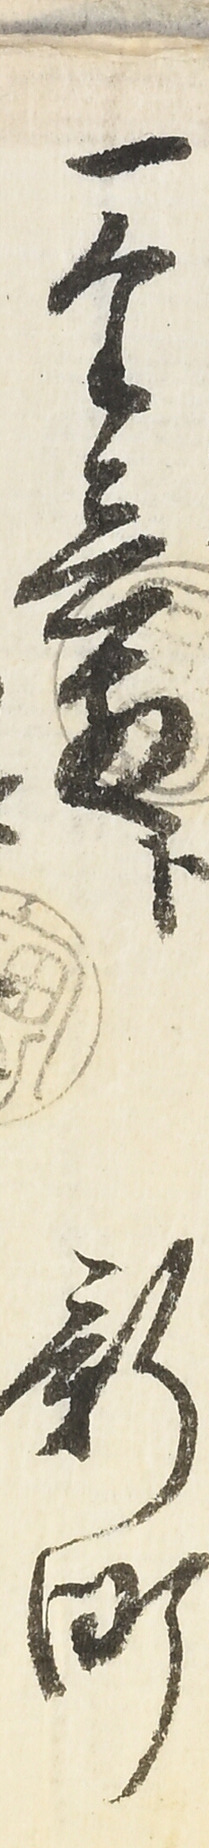一金壱両ト新町
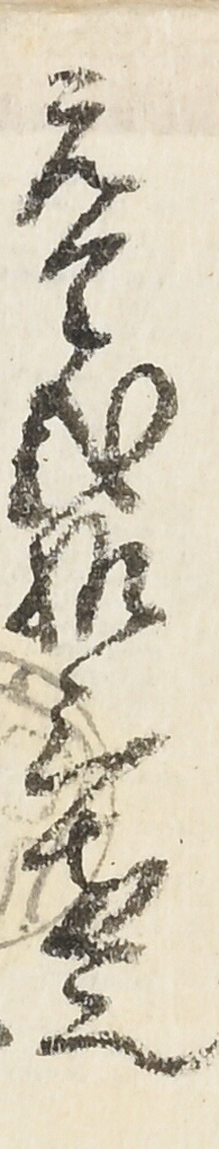元金弐拾三両也
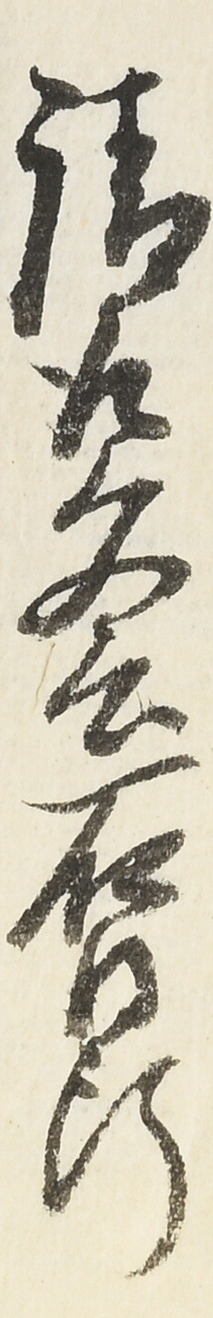請取文言右同断
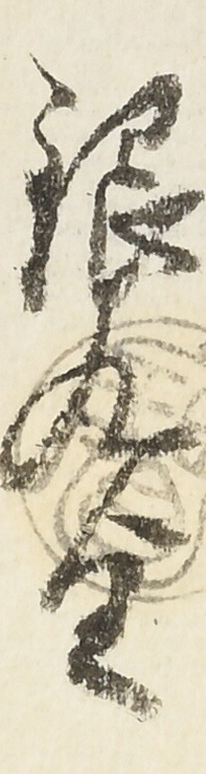銀九匁
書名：御才覚金御利足割渡扣帳
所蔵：伊那市立高遠町図書館・合同会社AMANE
